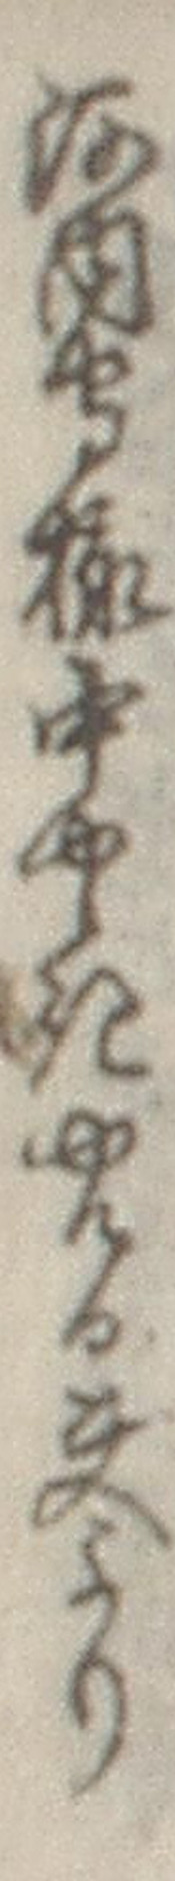河内守様中やしきやける夫より
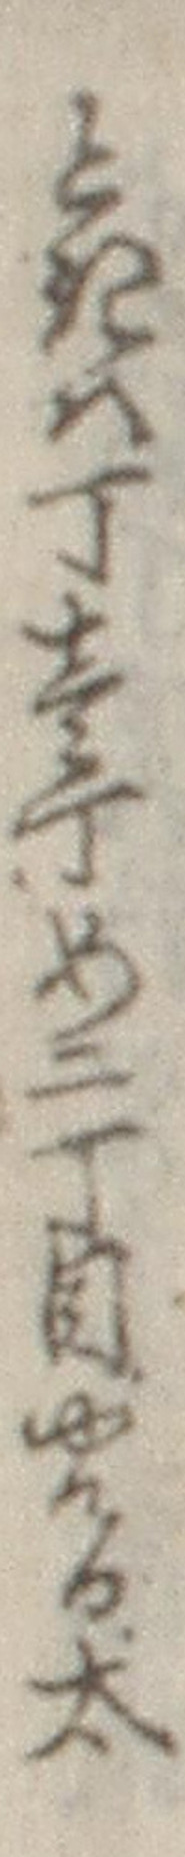ときは丁壱丁め二丁目やける太
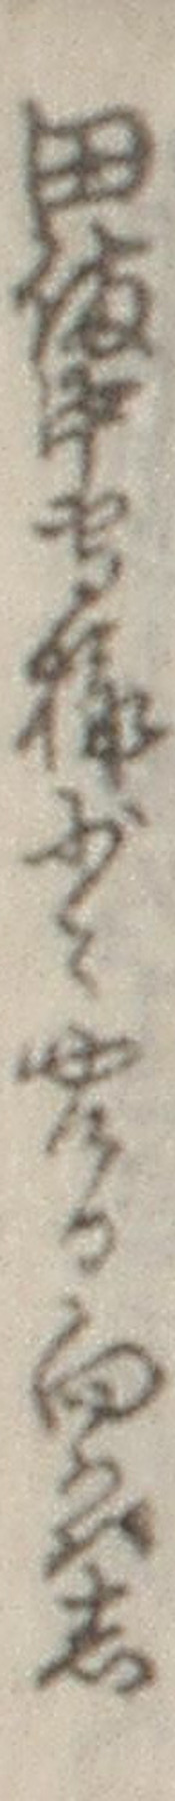田備中守様少〻やける向かはし
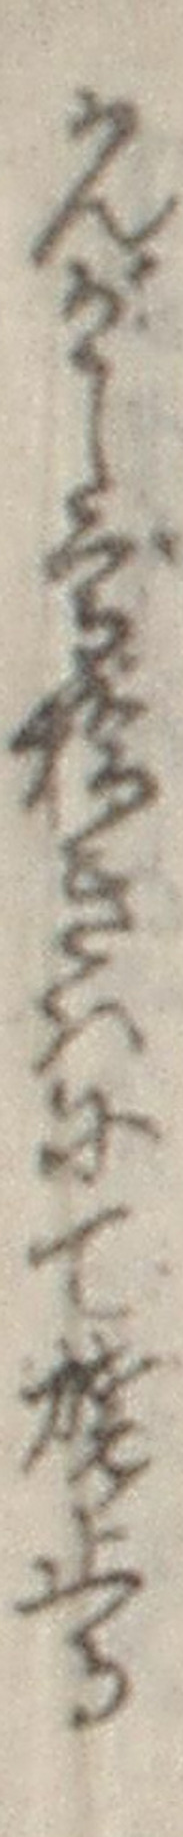かんがし高橋きはにて焼止る
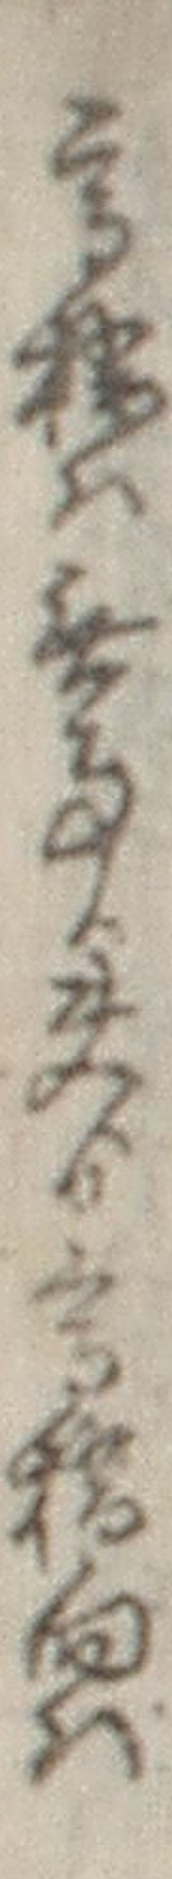高橋は無事夫ゟ高橋向は
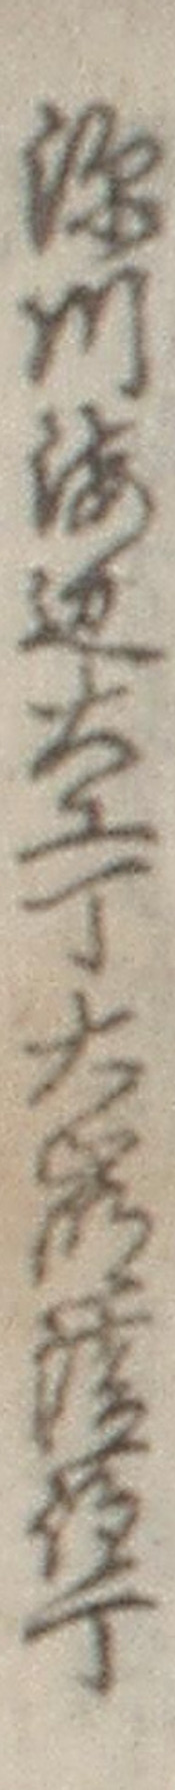深川海辺大工丁大崩清住丁
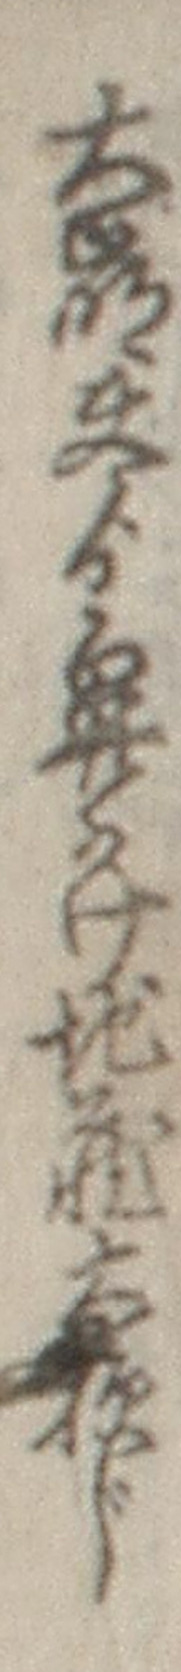大崩夫ゟ鼻かけ地蔵大損じ
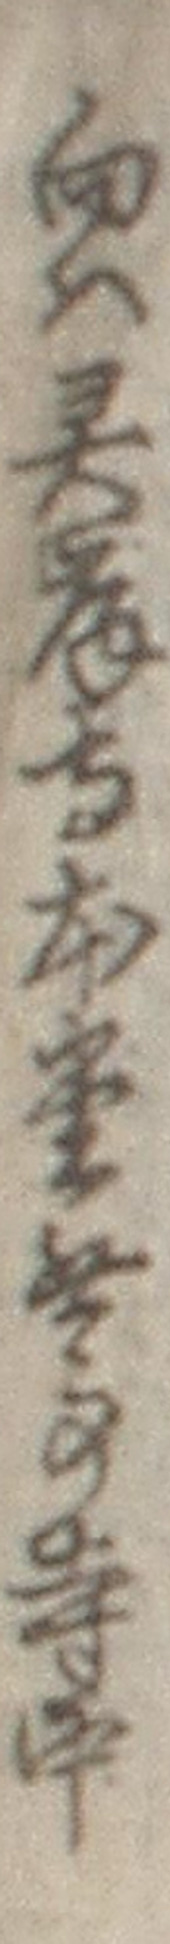向は霊岸寺本堂無事寺中

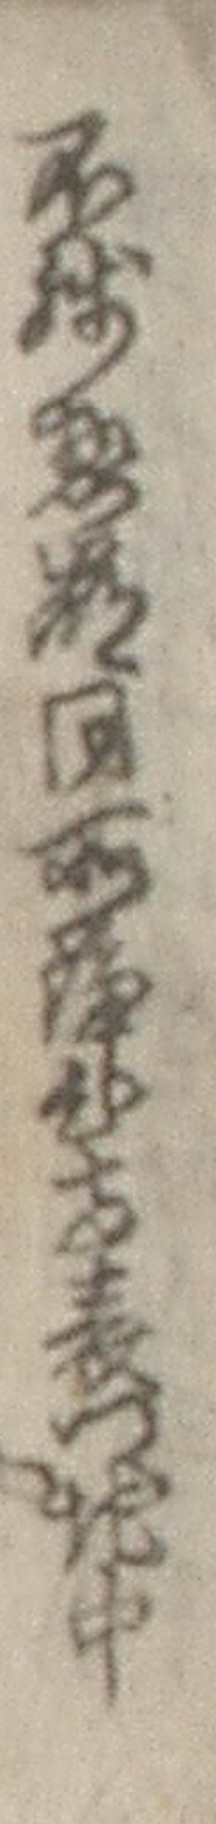不残惣崩同所浄心寺表門地中
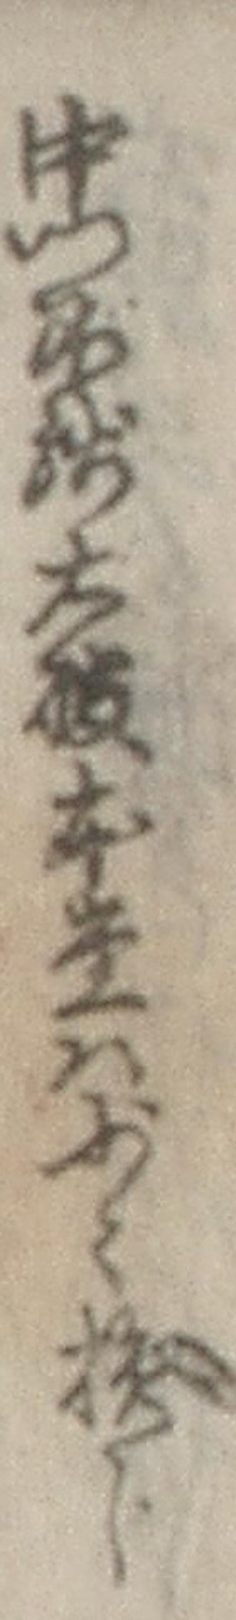中門不残大破本堂は少〻損じ
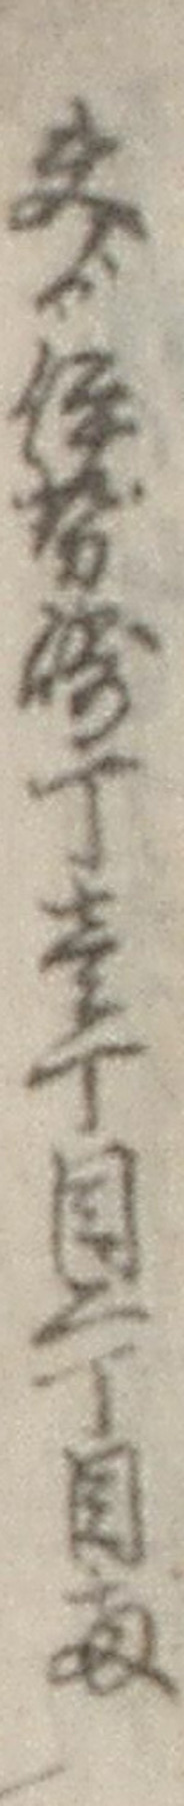夫ゟ伊勢崎丁壱丁目二丁目両
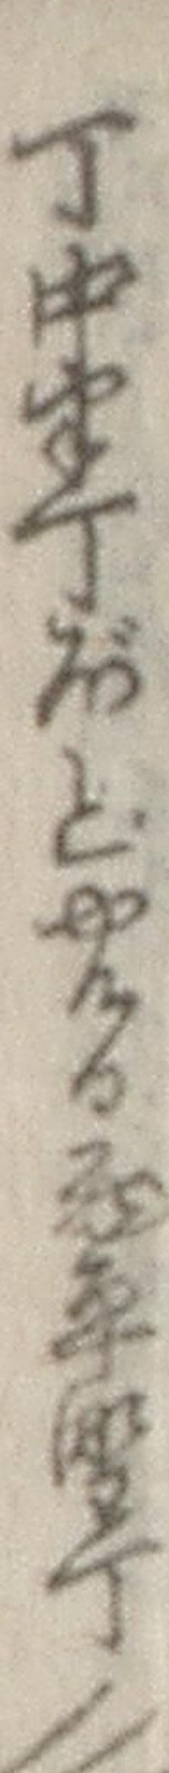丁中半丁ぼとやける西平野丁
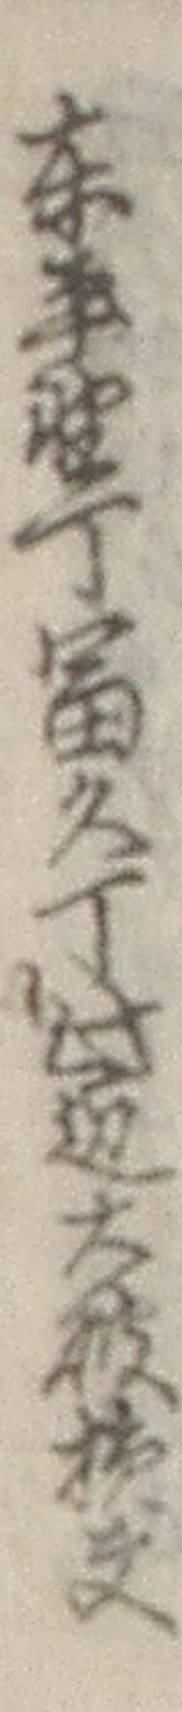東平野丁冨久丁此辺大破損夫
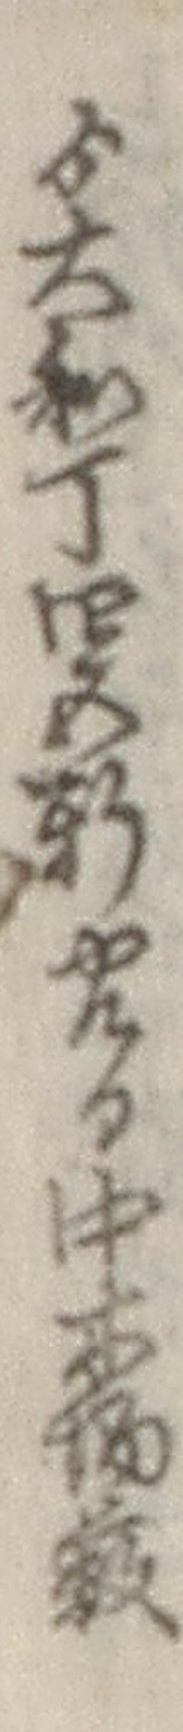ゟ大和丁四五軒やける中木場薮
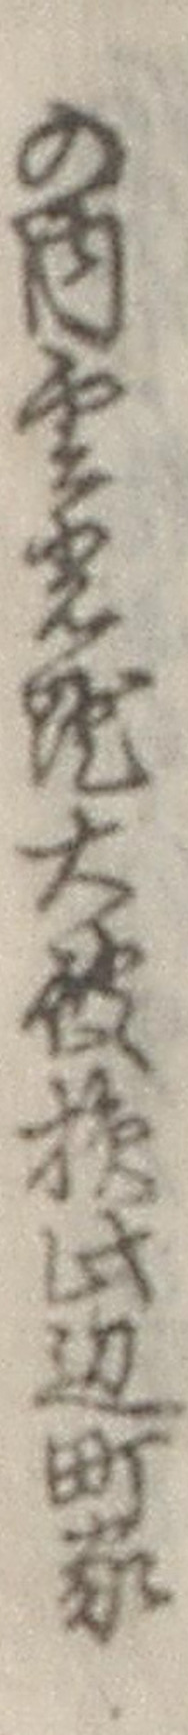の内雲光院大破損此辺町家
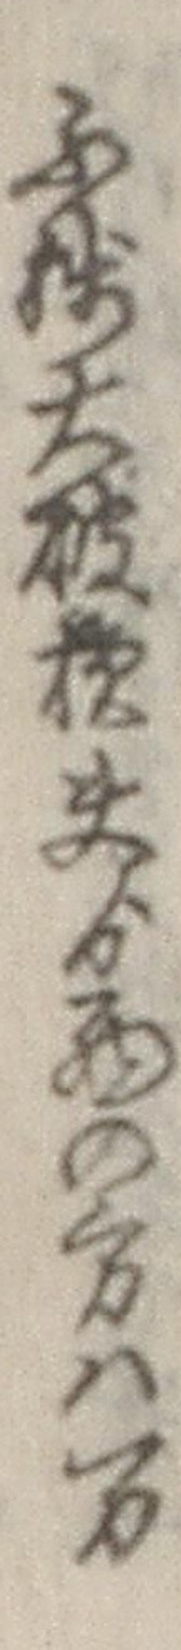不残大破損夫ゟ西の方ハ万
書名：江戸　大地震臣細録　全
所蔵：東京大学地震研究所図書室 Earthquake Research Institute Library, The University of Tokyo, JAPAN
